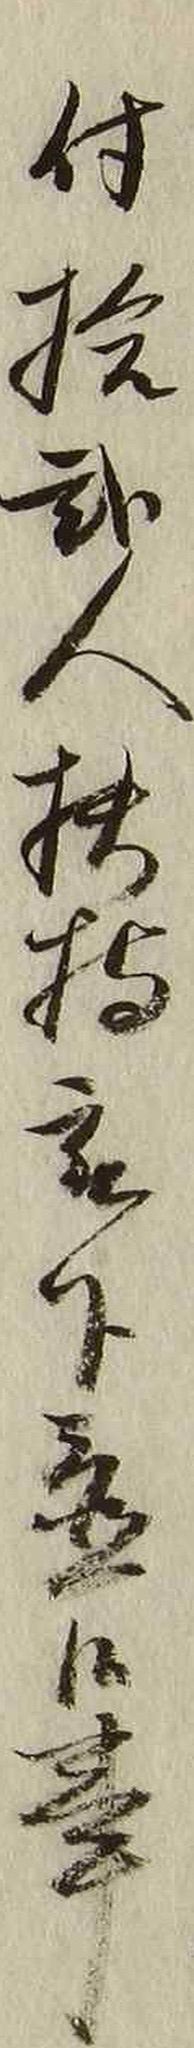付拾弐人扶持被下置候事
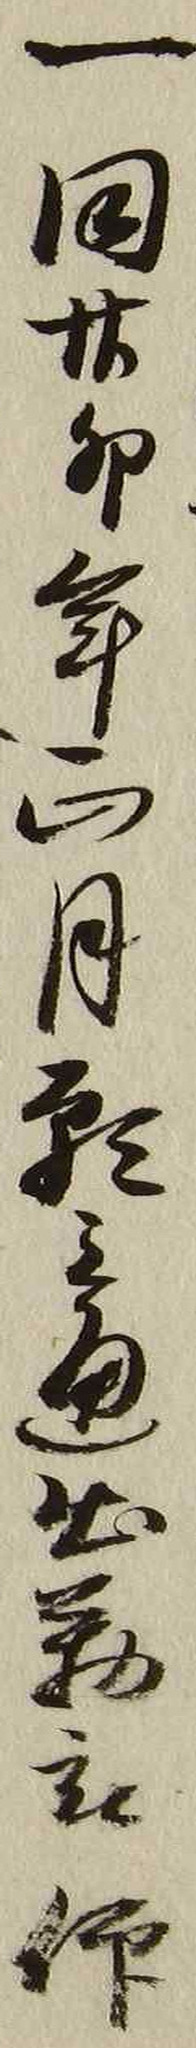一同廿卯年正月願之通出勤被仰
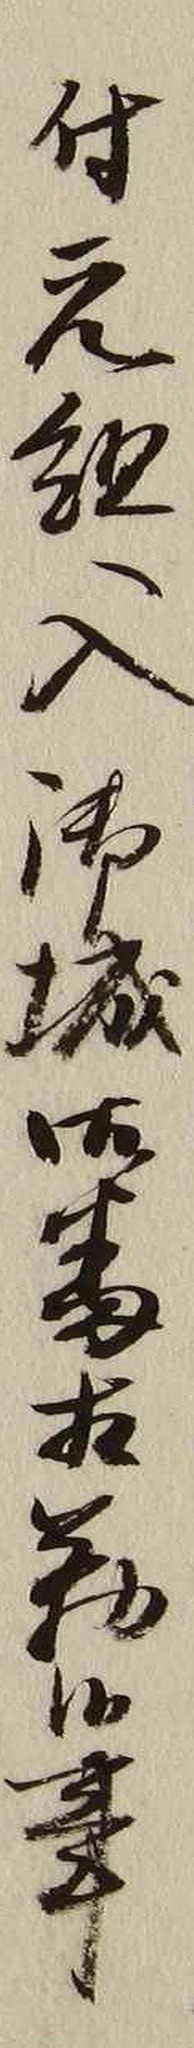付元組へ入御城御番相勤候事
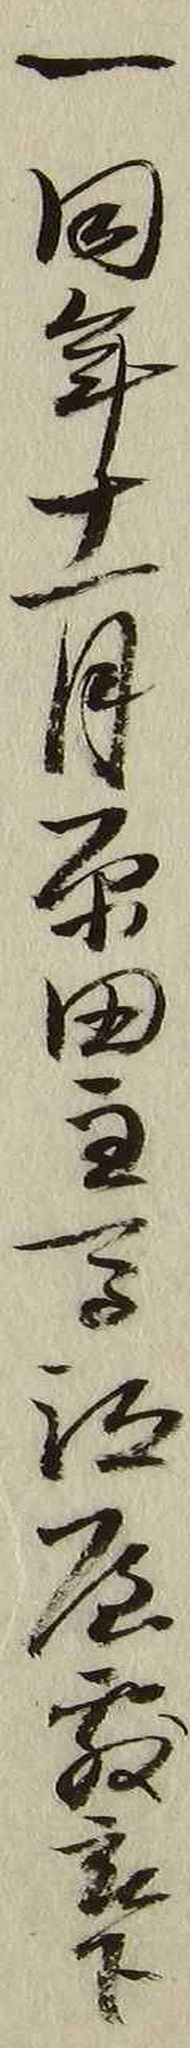一同年十一月原田主馬跡屋敷被下
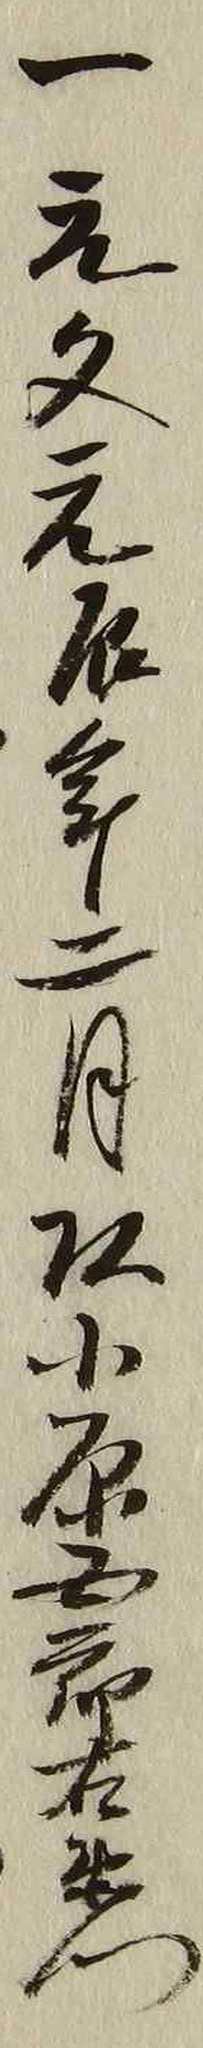一元文元辰年二月頭小原五郎右衛門
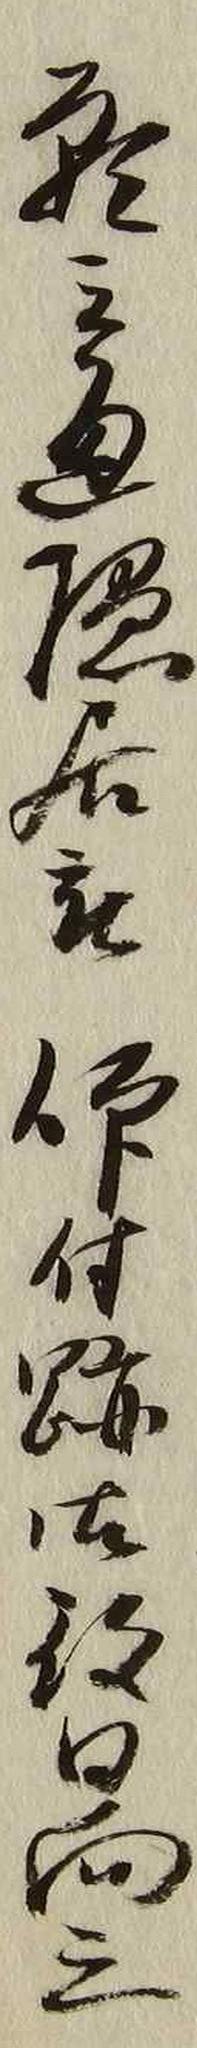願之通隠居被仰付跡御役日向三
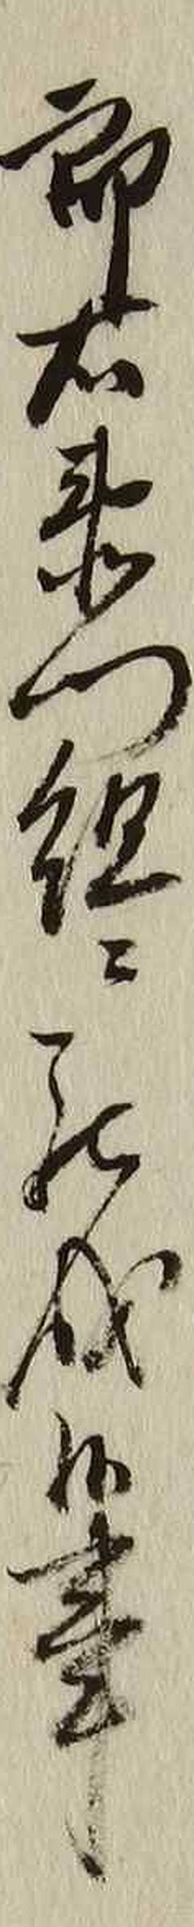郎右衛門組ニ罷成候事
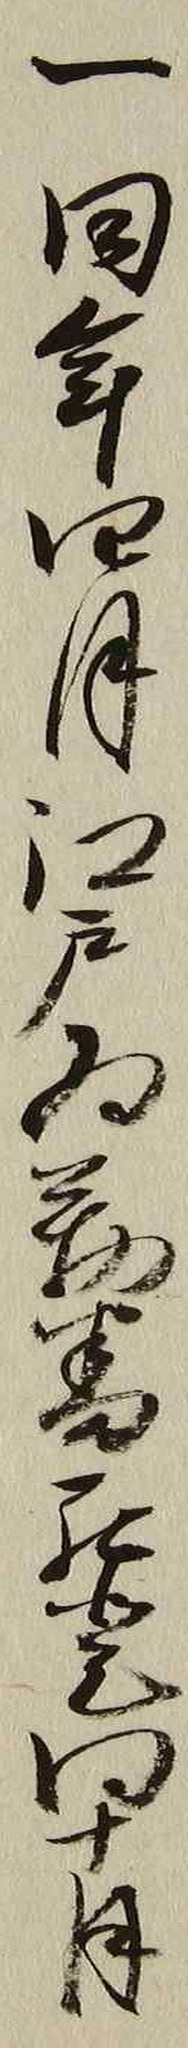一同年四月江戸為勤番罷登同十月
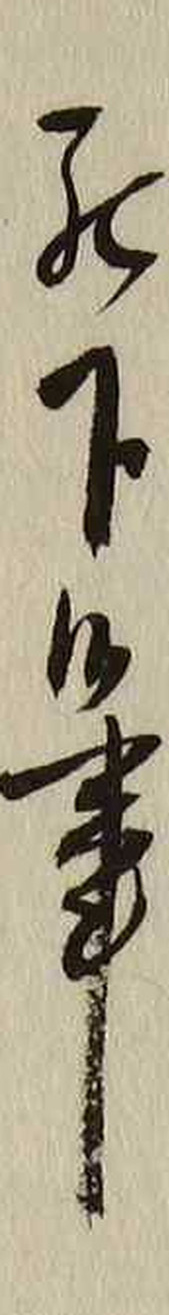罷下候事
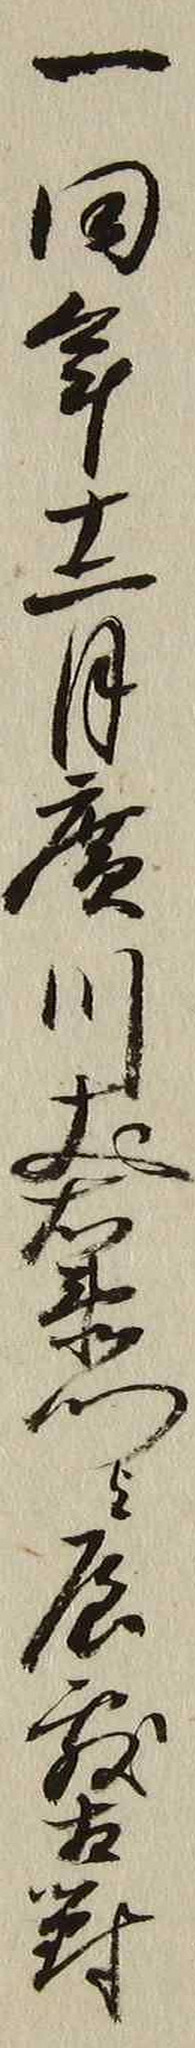一同年十二月広川丈右衛門与屋敷相対
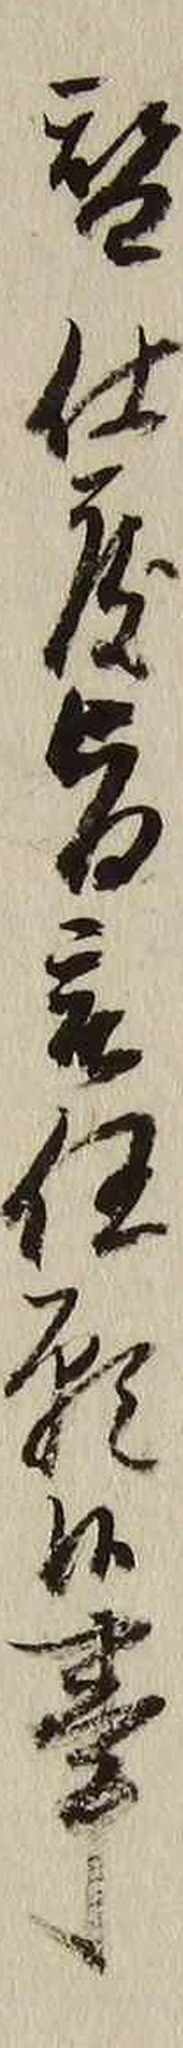替仕度旨被任願候事
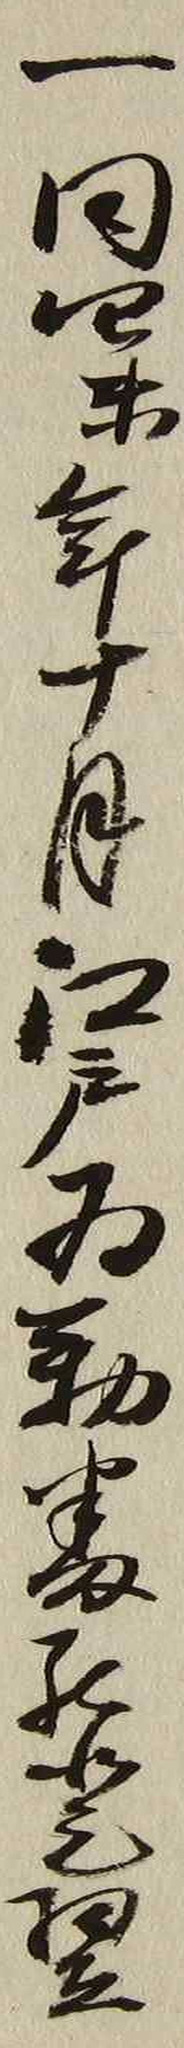一同四未年十月江戸為勤番罷登翌
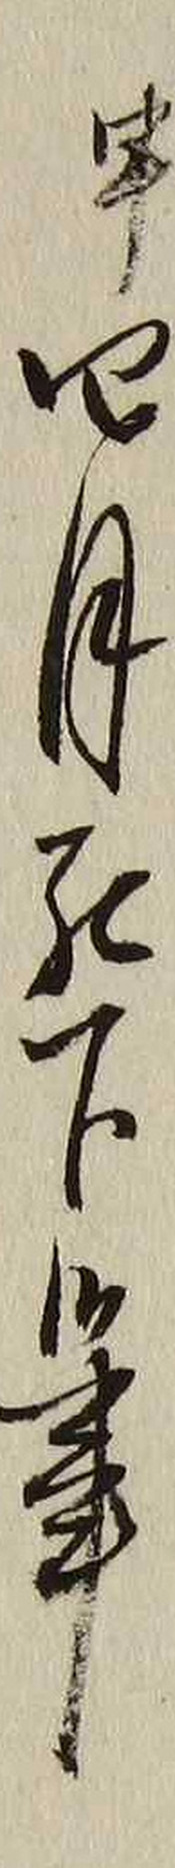申四月罷下候事
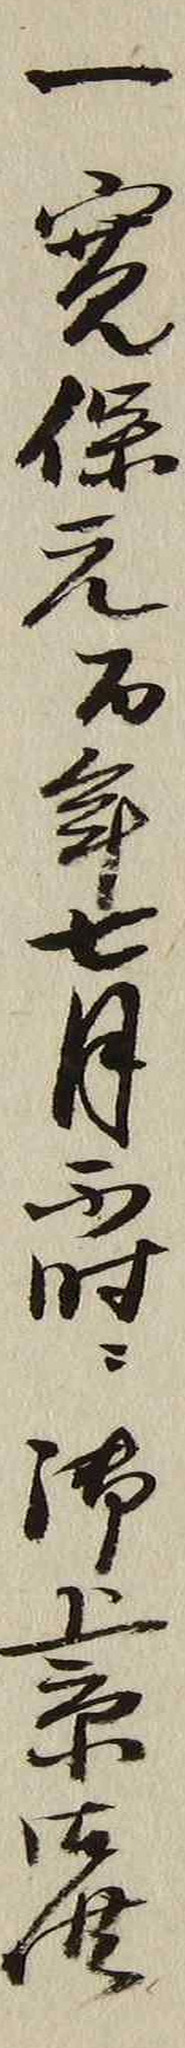一寛保元酉年七月不時ニ御上京御供
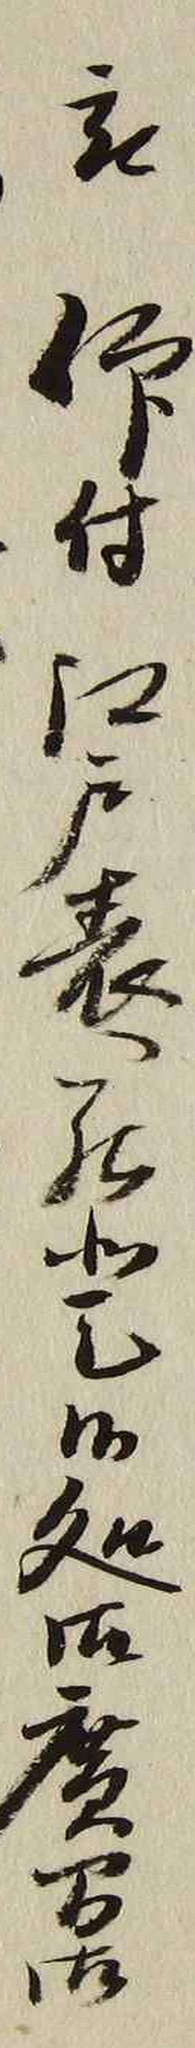被仰付江戸表へ罷登候処御広間御
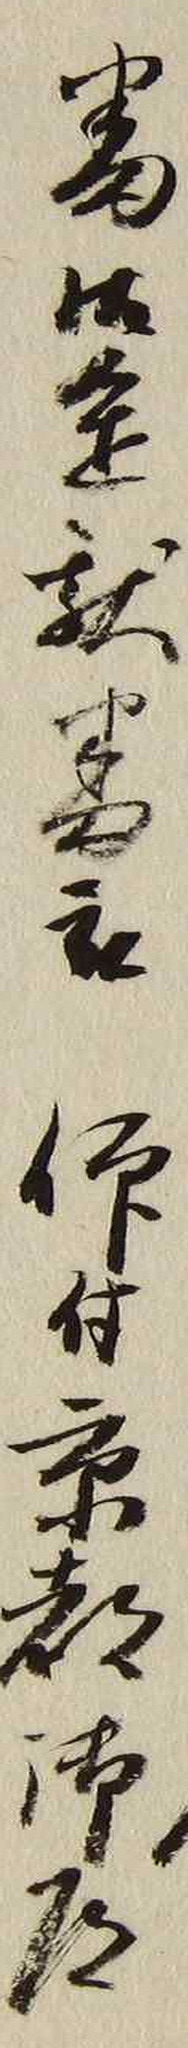番御進献番被仰付京都御道
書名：諸士系譜　巻之356　す之部6
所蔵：会津若松市立会津図書館
